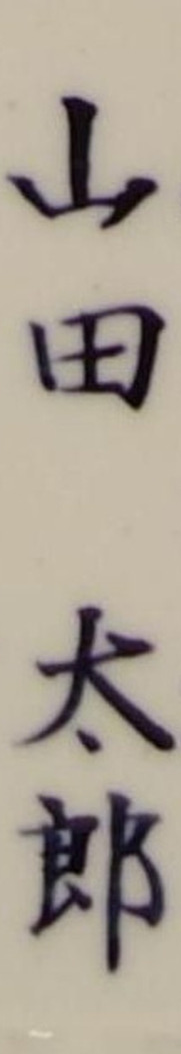山田太郎
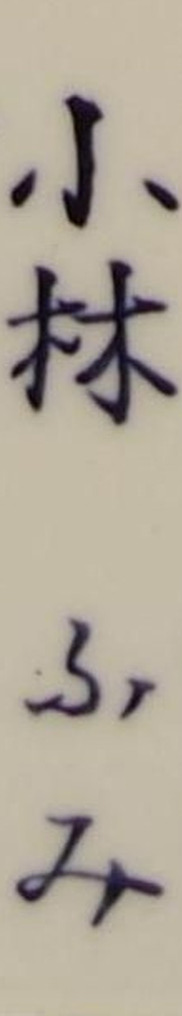小林ふみ
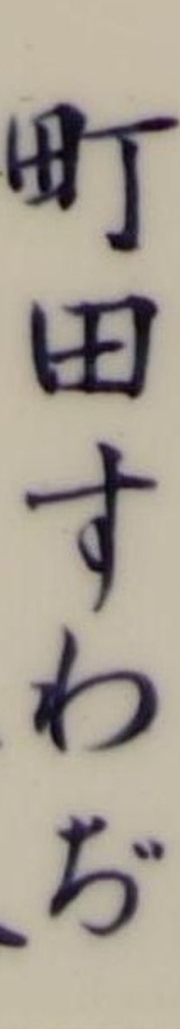町田すわぢ
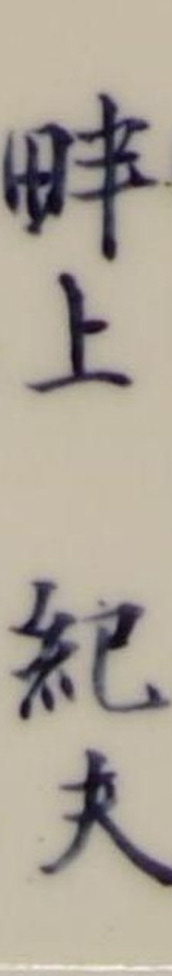畔上紀夫
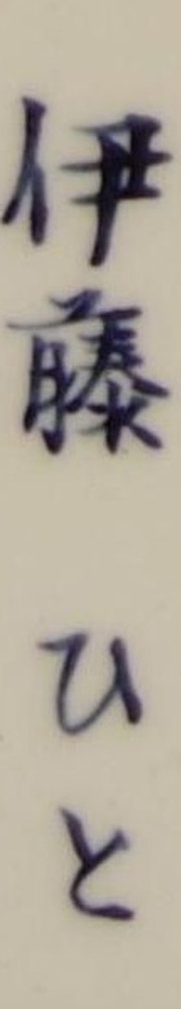伊藤ひと
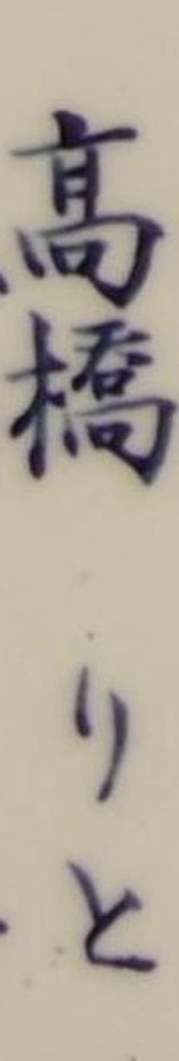高橋りと
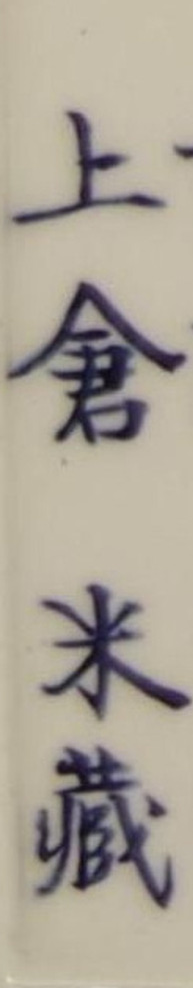上倉米蔵

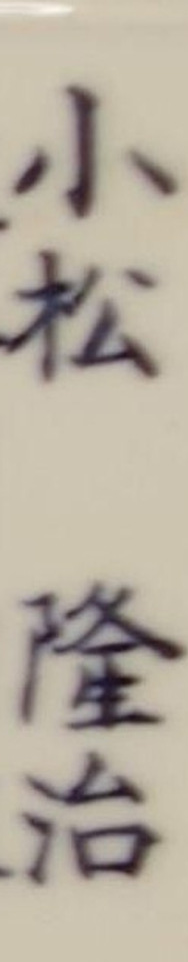小松隆治
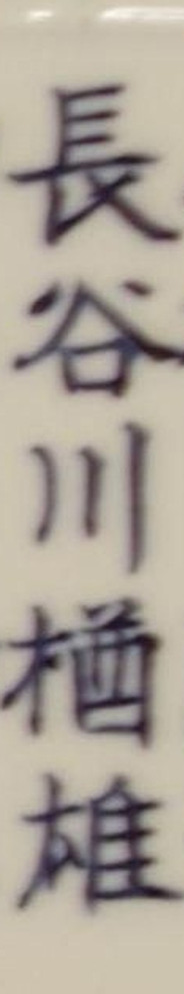長谷川栖雄
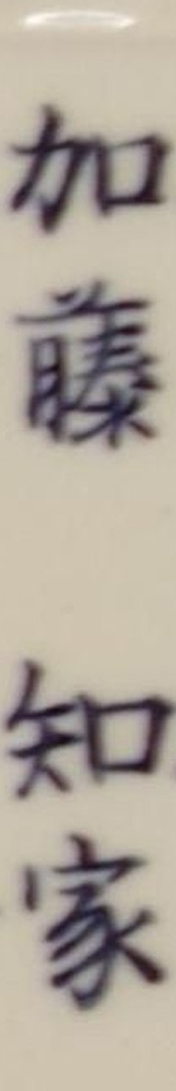加藤知家
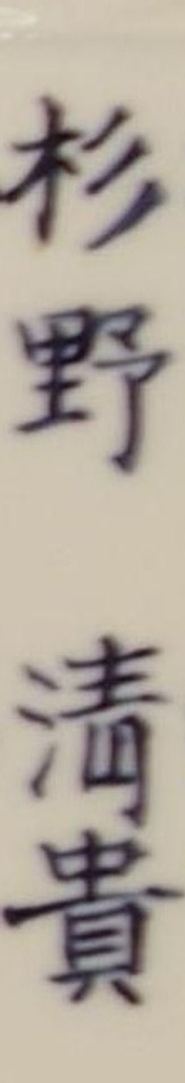杉野清貴
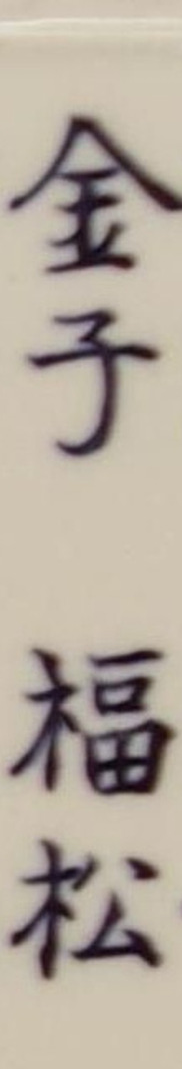金子福松
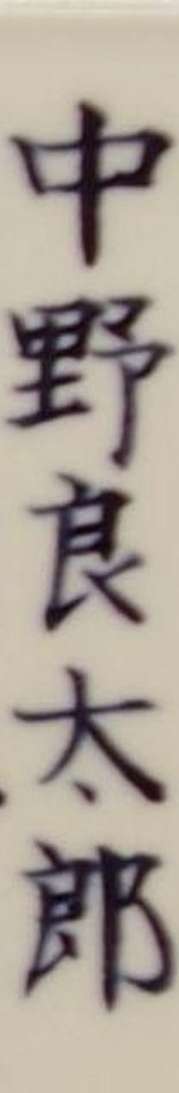中野良太郎
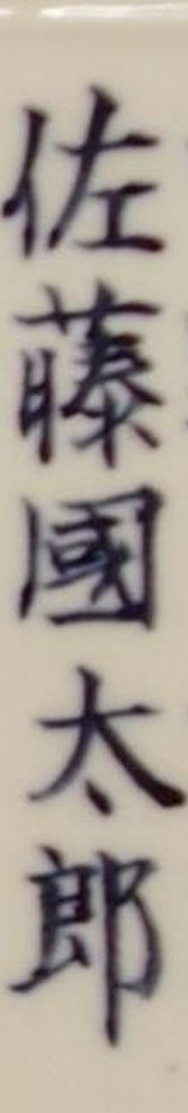佐藤國太郎
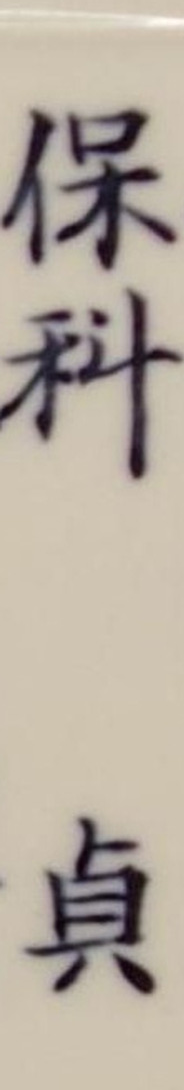保科貞
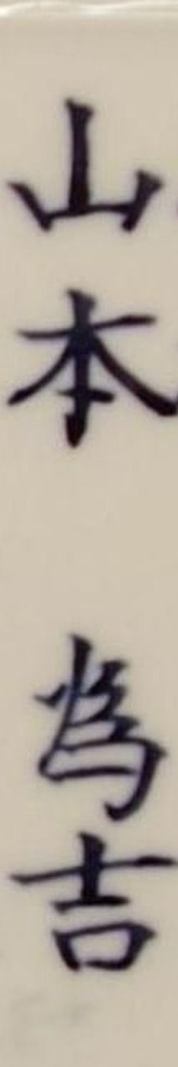山本為吉
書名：E~L
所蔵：高野山金剛峯寺
